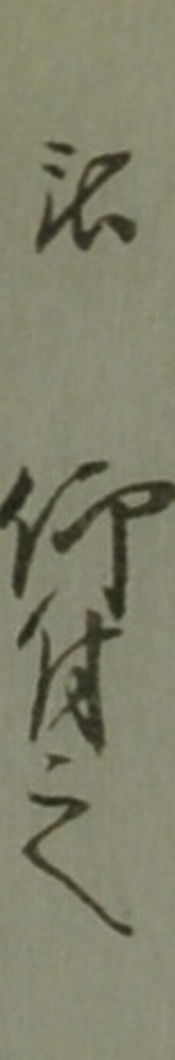被仰付之
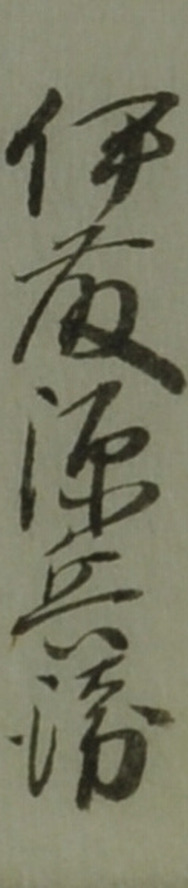伊藤源兵衛
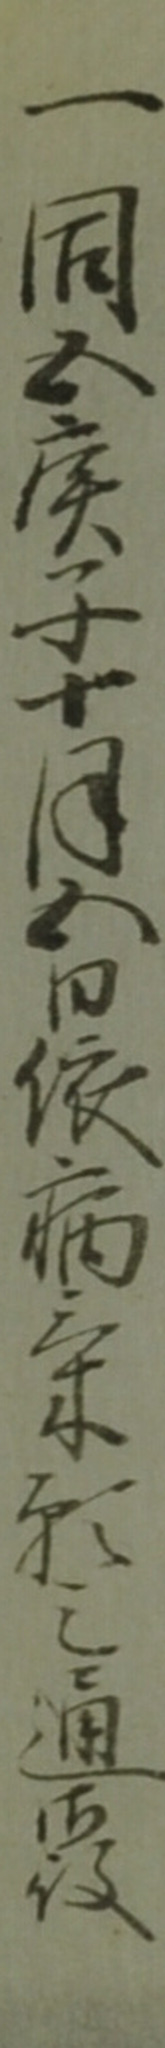一同五庚子十月五日依病気願之通御役
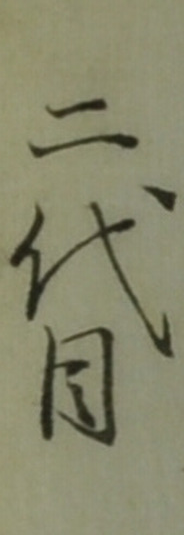二代目

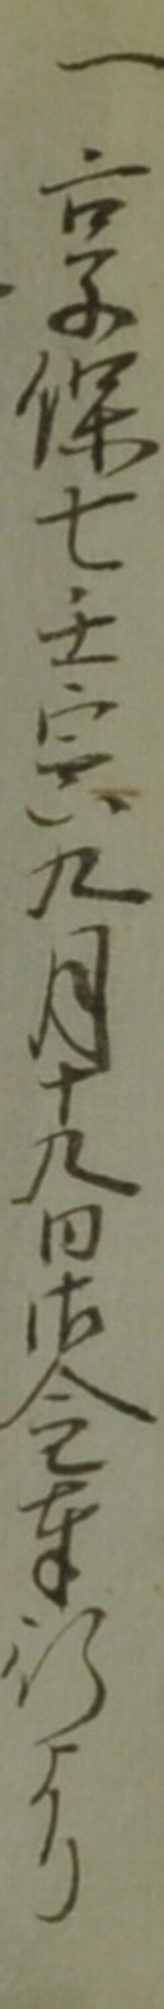一享和七壬寅九月十九日御金奉行より
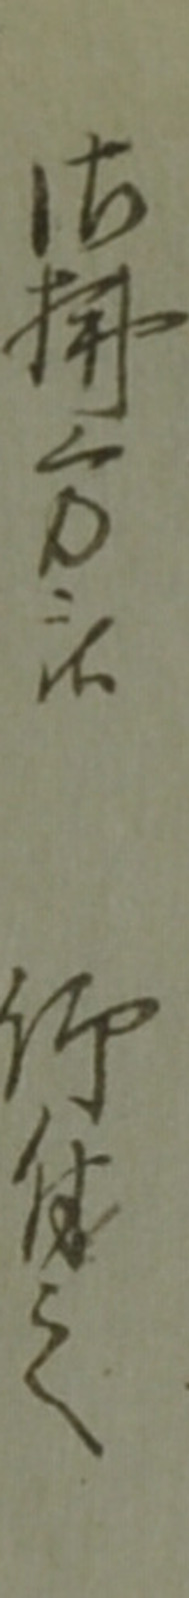御払方被仰付之
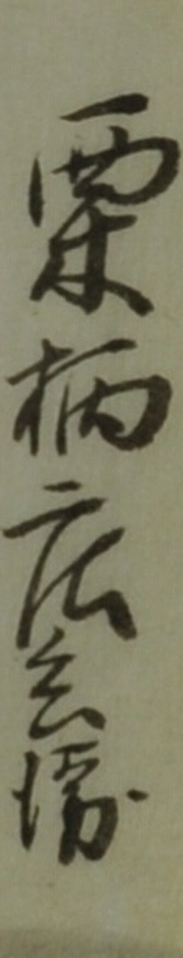栗柄庄兵衛
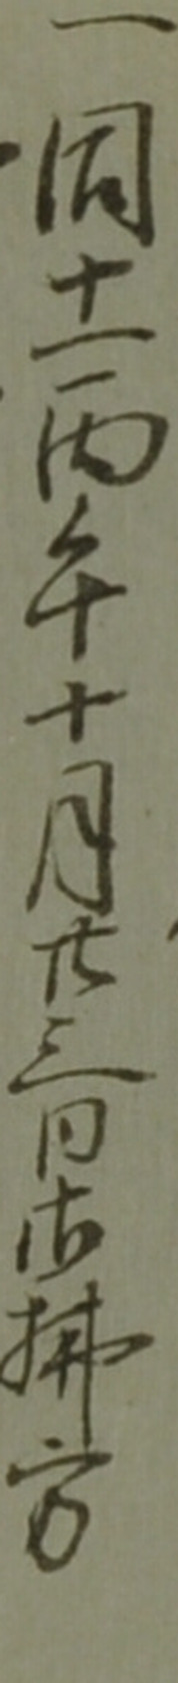一同十一丙午十月廿三日御払方
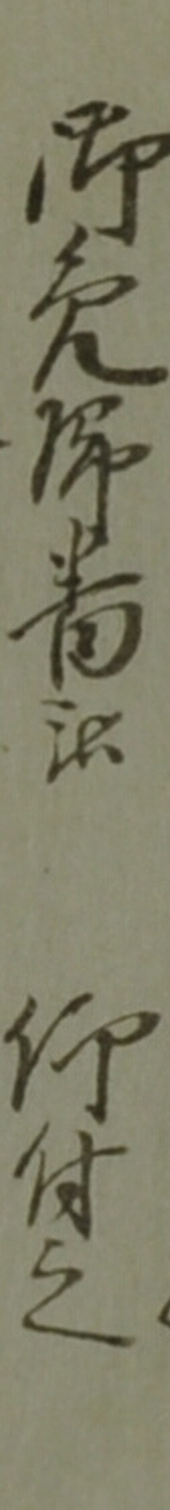御免帰番被仰付之
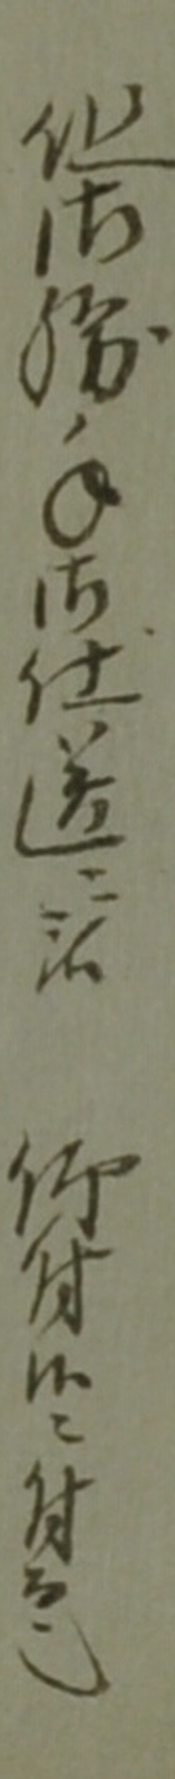但御勝手御仕送ニ被仰付候ニ付而已
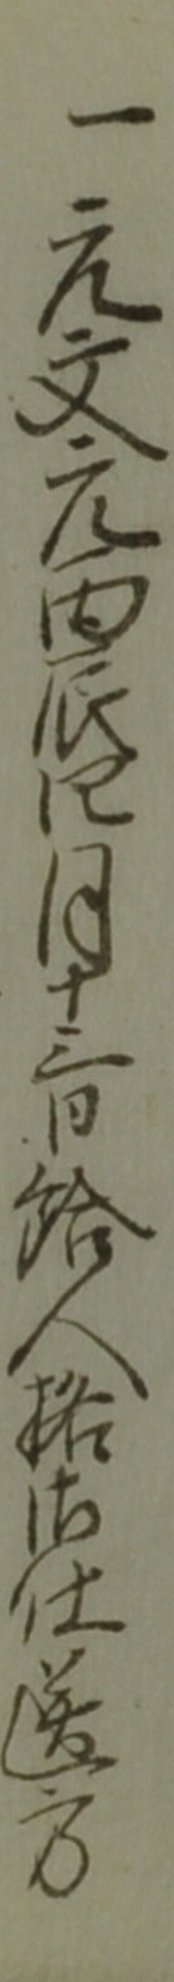一元文元丙辰四月十三日給人格御仕送方
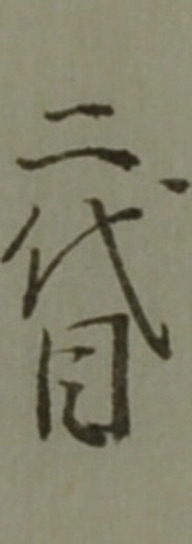二代目
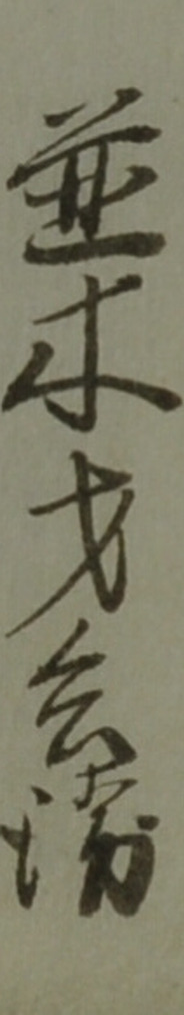並木才兵衛
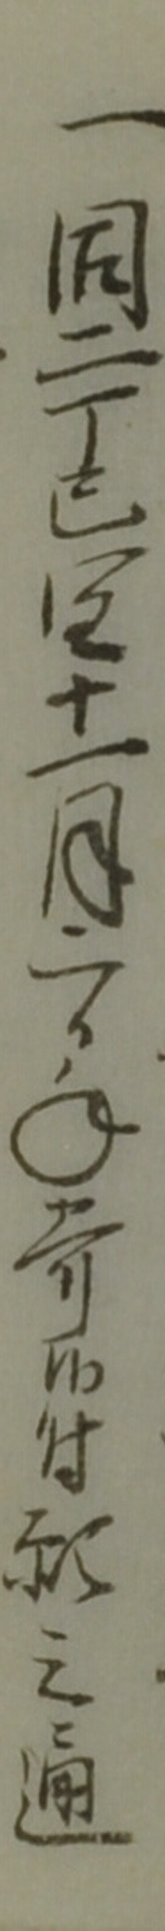一同ニ丁巳閏十一月二日年寄候付願之通
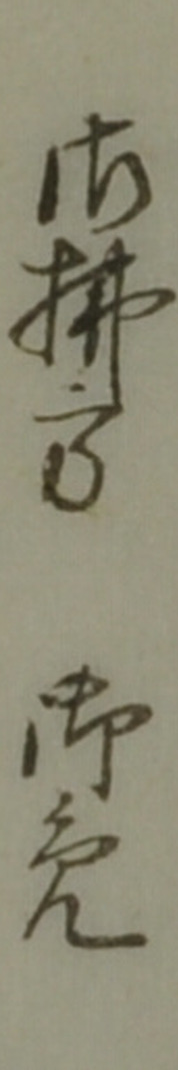御払方御免
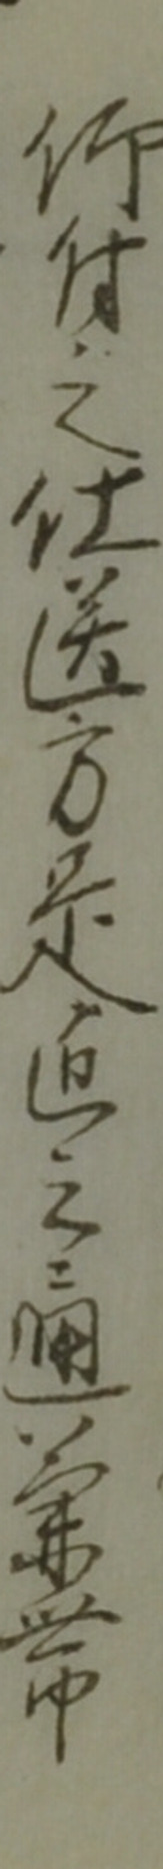仰付之仕送方是迄之通兼帯
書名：諸御役代々録（八）
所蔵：伊那市立高遠町図書館・合同会社AMANE
